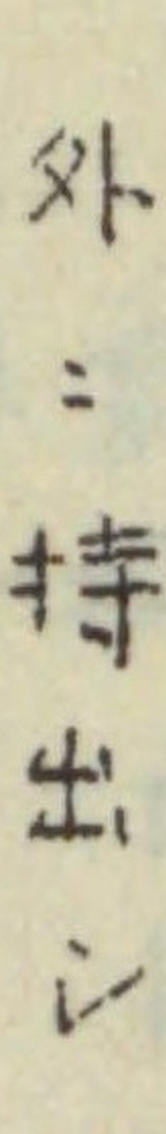外二持出シ
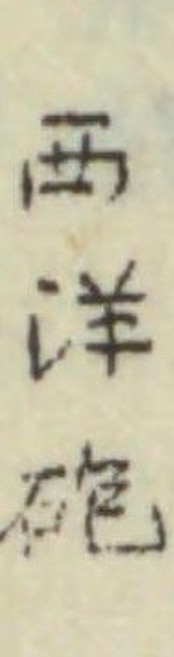西洋砲
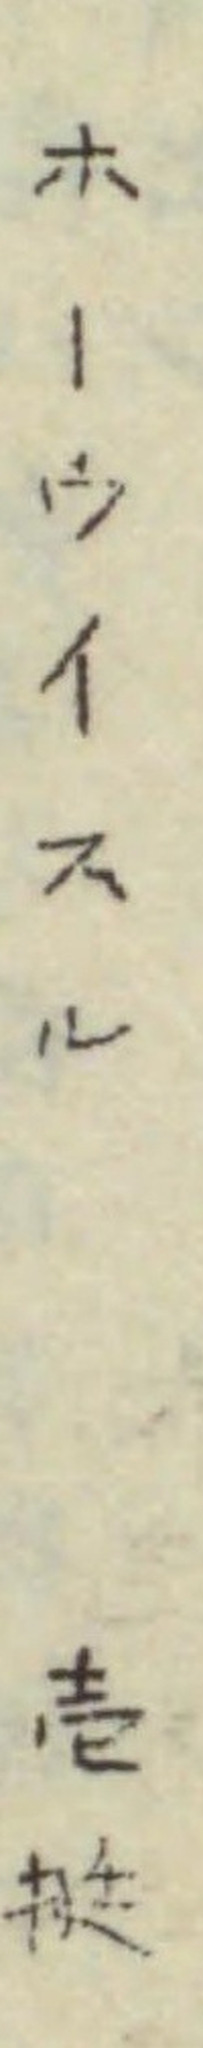ホーウイスル壱挺
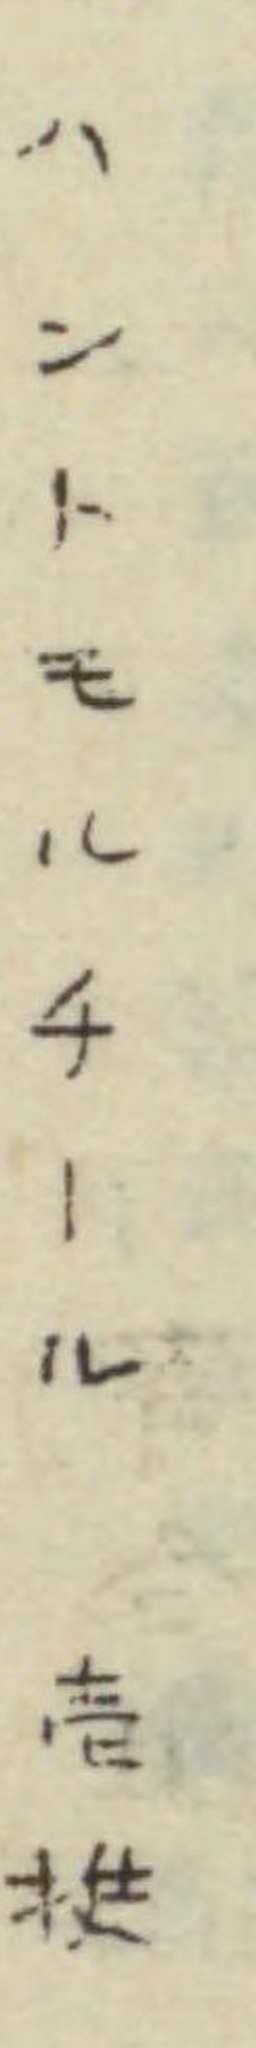ハントモルチ―ㇽ壱挺
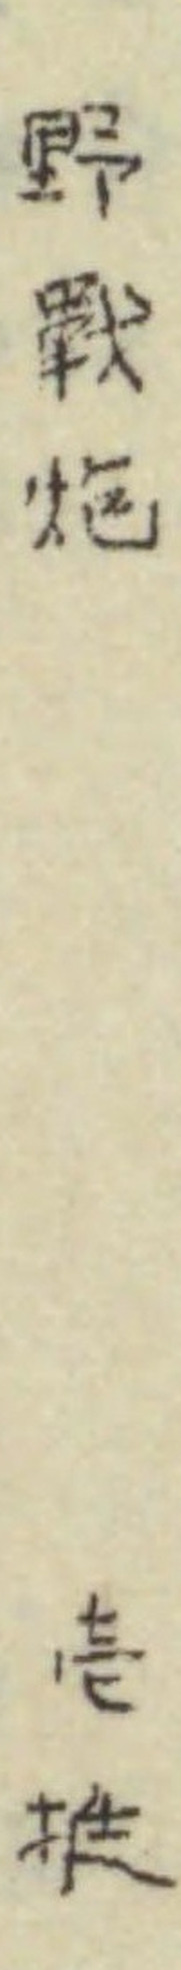野戦炮壱挺
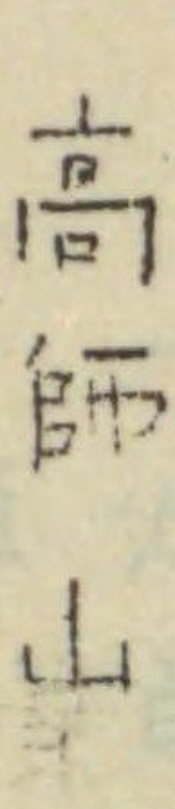高師山
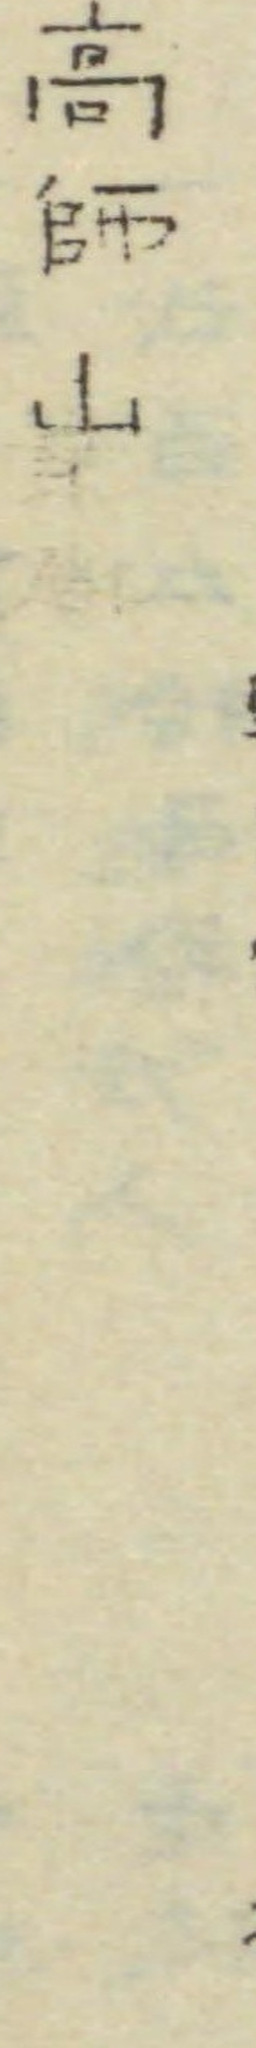高師山
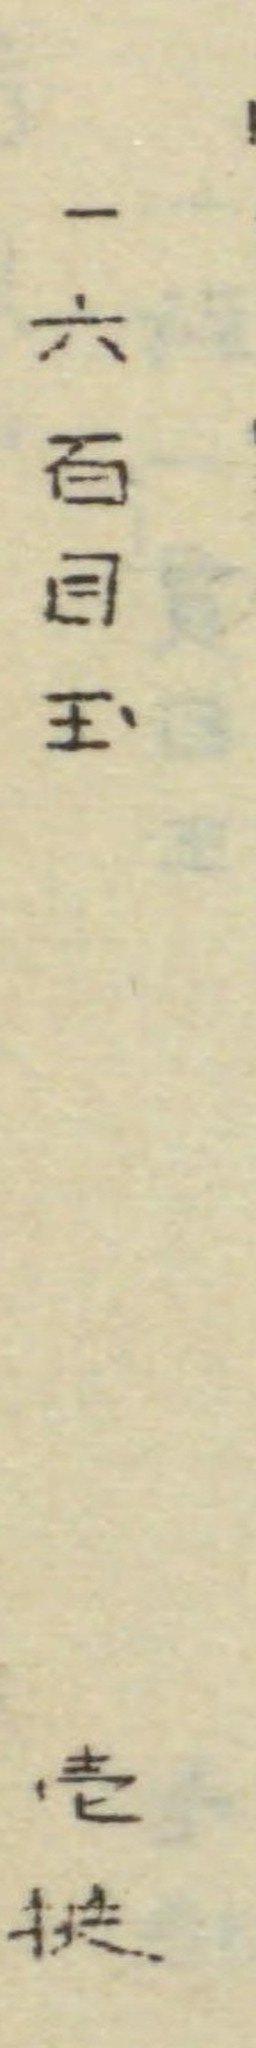一六百目玉壱挺

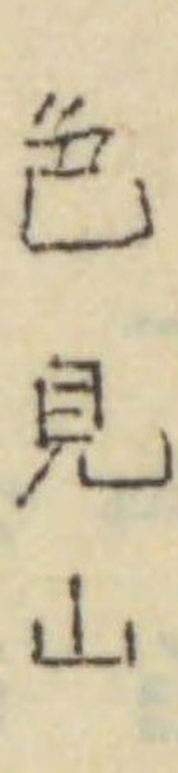色見山
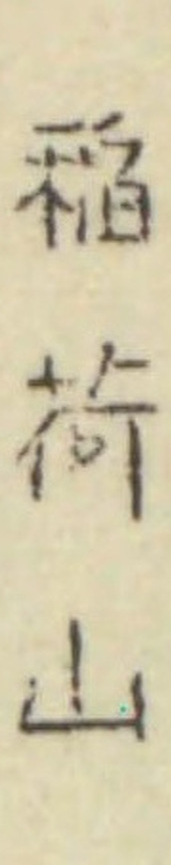稲荷山
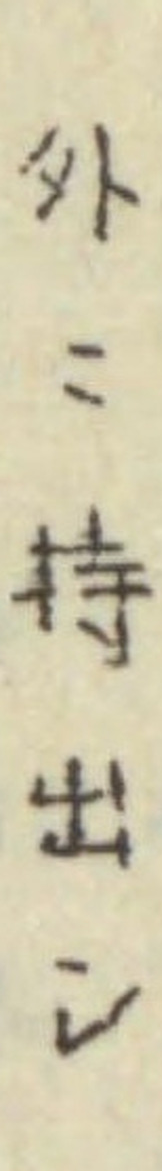外二持出シ
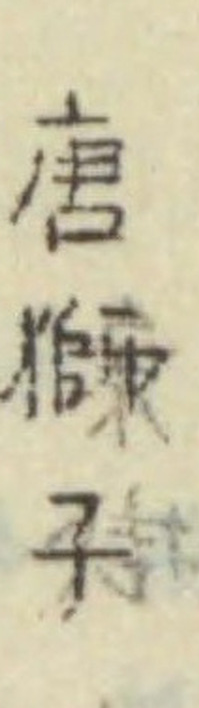唐獅子
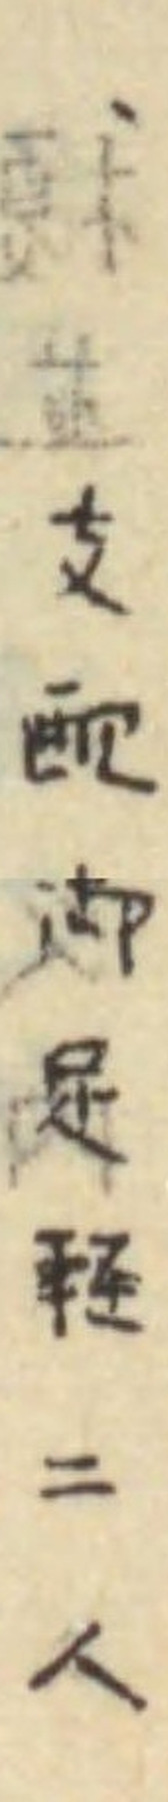支配御足軽二人
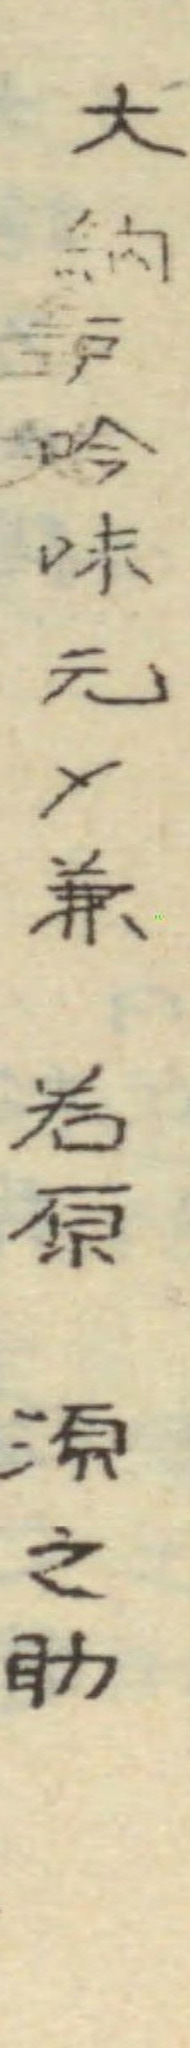乗掛大納戸吟味元〆兼若原源之助
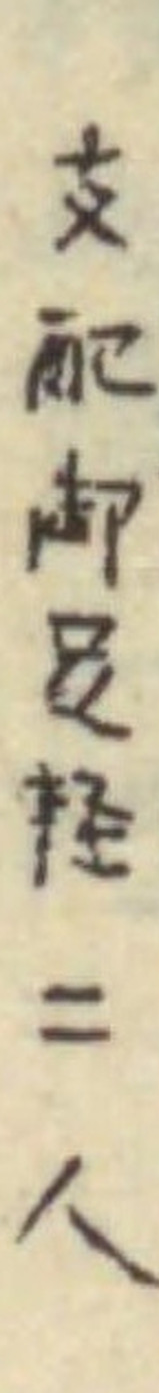支配御足軽二人
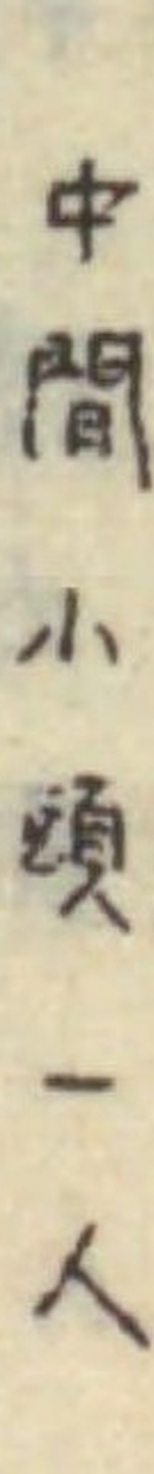中間小頭一人
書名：三河吉田藩動員史料
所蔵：国立国会図書館 National Diet Library, JAPAN
